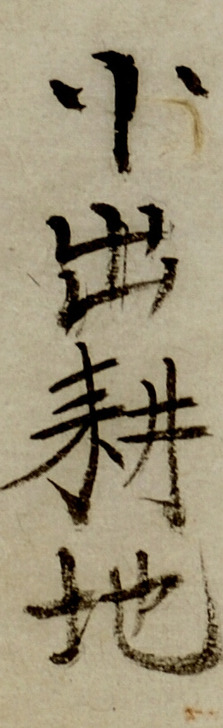小出耕地
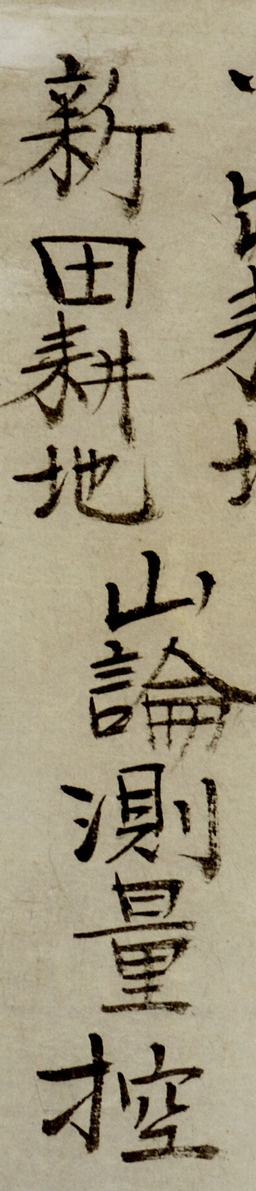新田耕地山論測量控
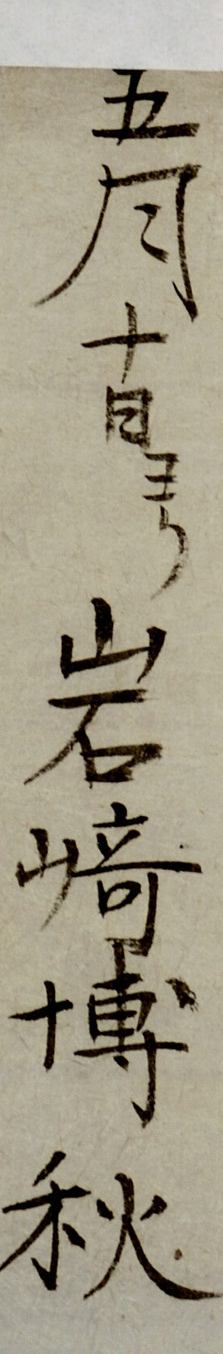五月十日ヨリ岩崎博秋

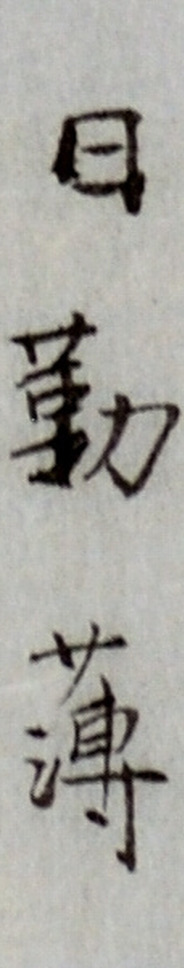日勤簿
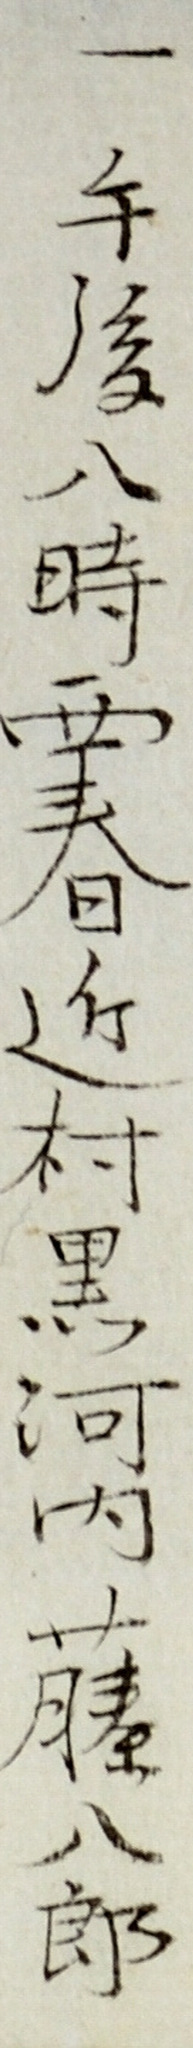一午後八時西春近村黒河内藤八郎
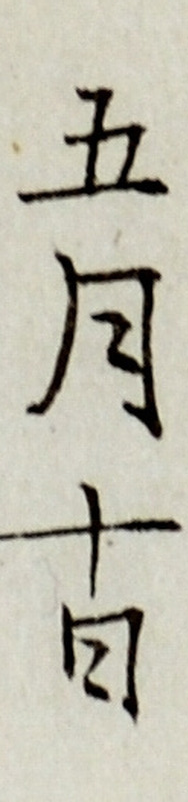五月十日
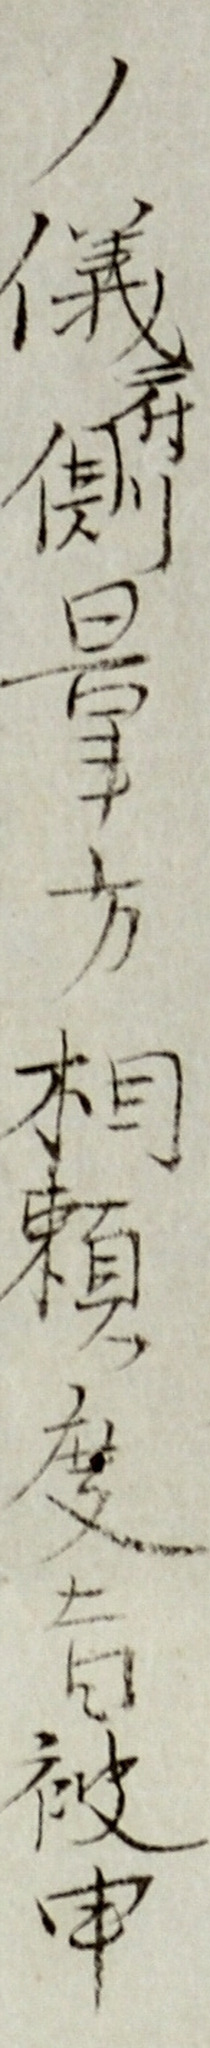ノ儀ニ付測量方相頼度旨被申
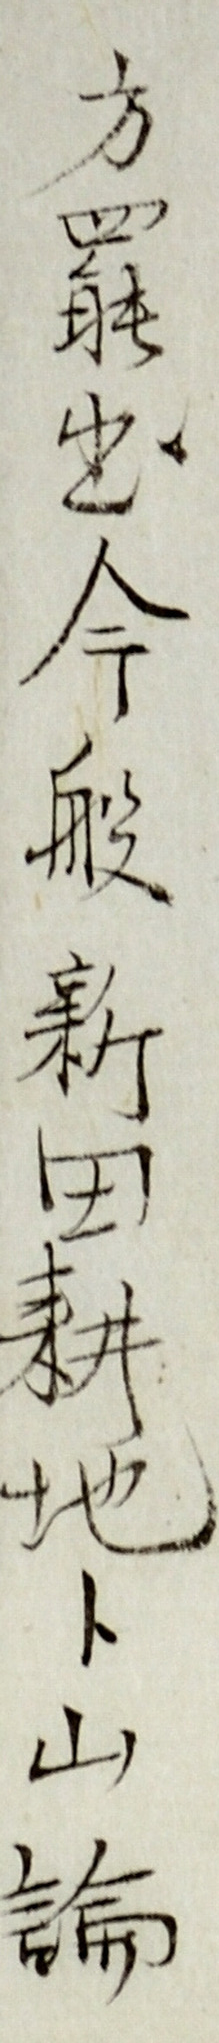方罷出今般新田耕地ト山論
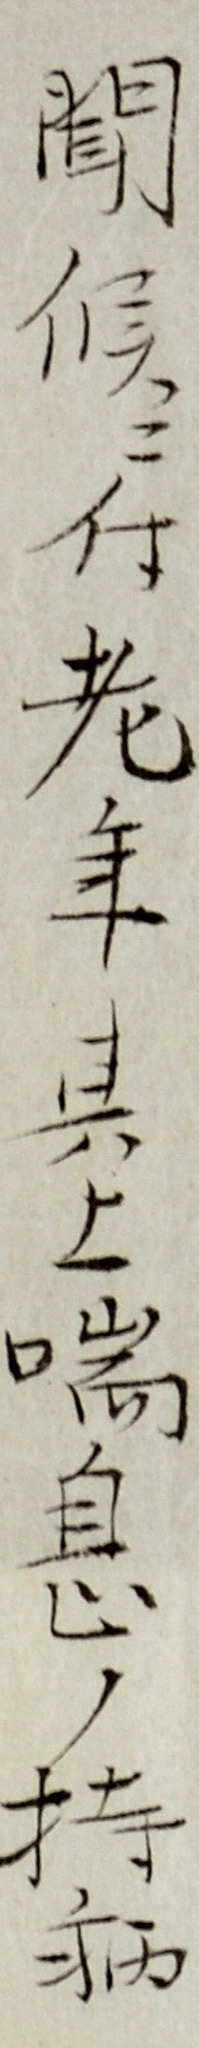聞候ニ付老年其上喘息ノ持病
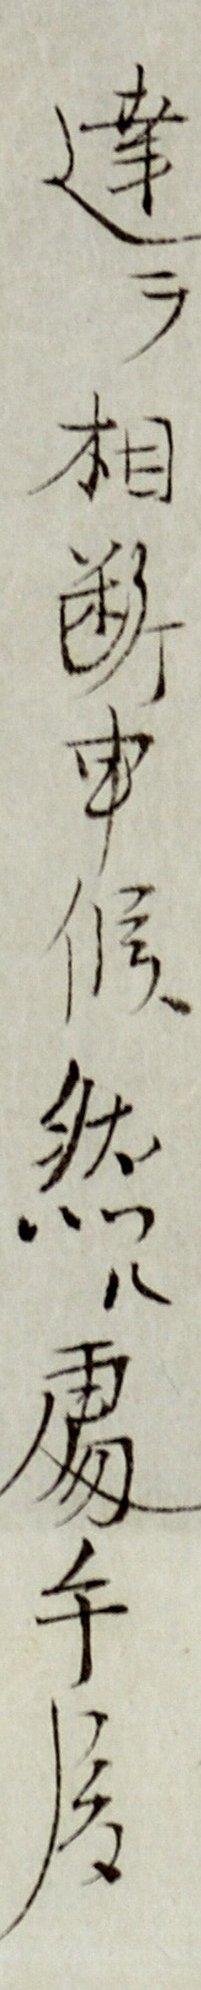達ヲ相断申候然ル処午後
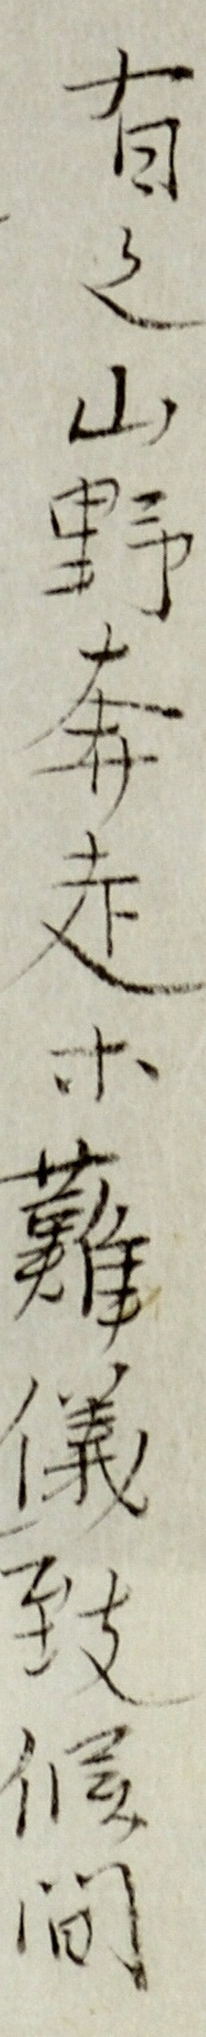有之山野奔走等難義致候間
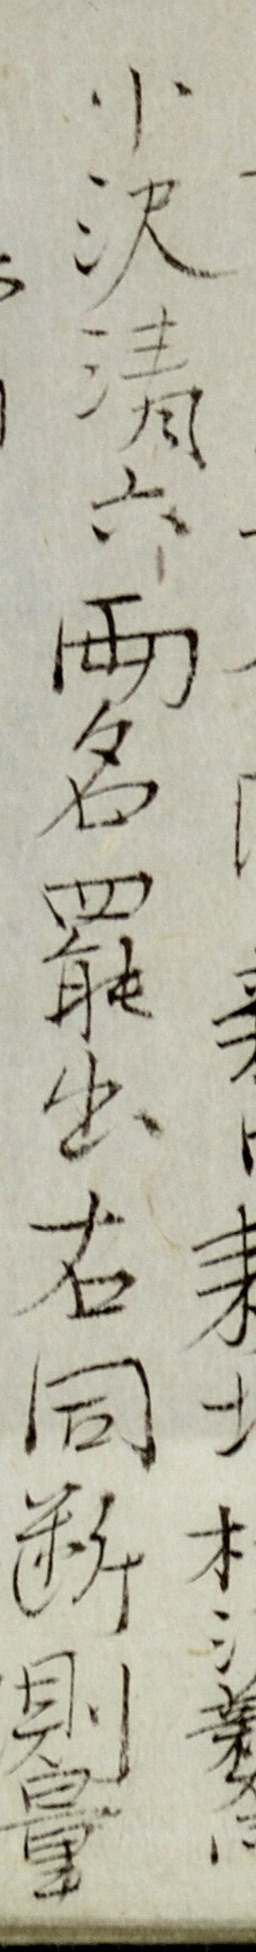小沢清六両名罷出右同断測量
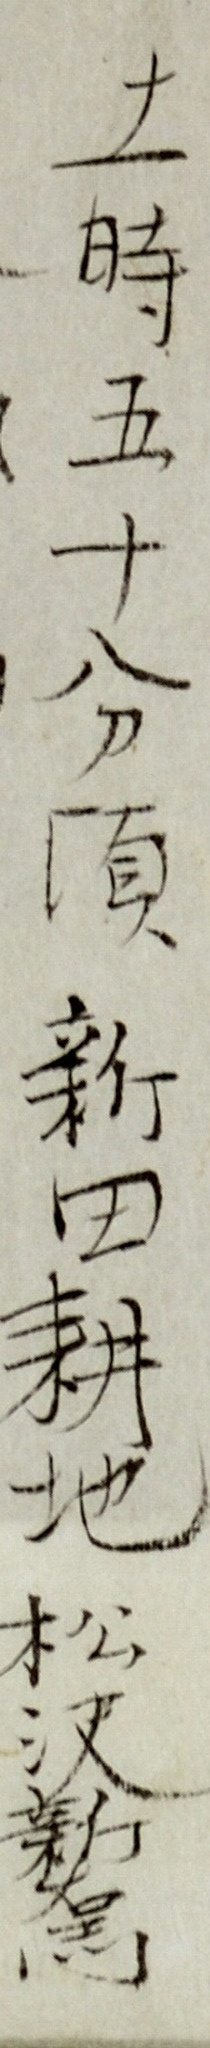十一時五十分頃新田耕地松沢新右衛門
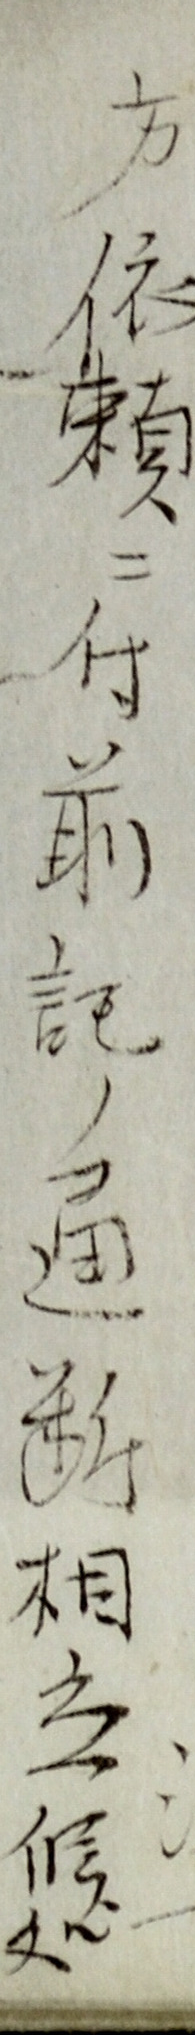方依頼ニ付前記ノ通断相立候処
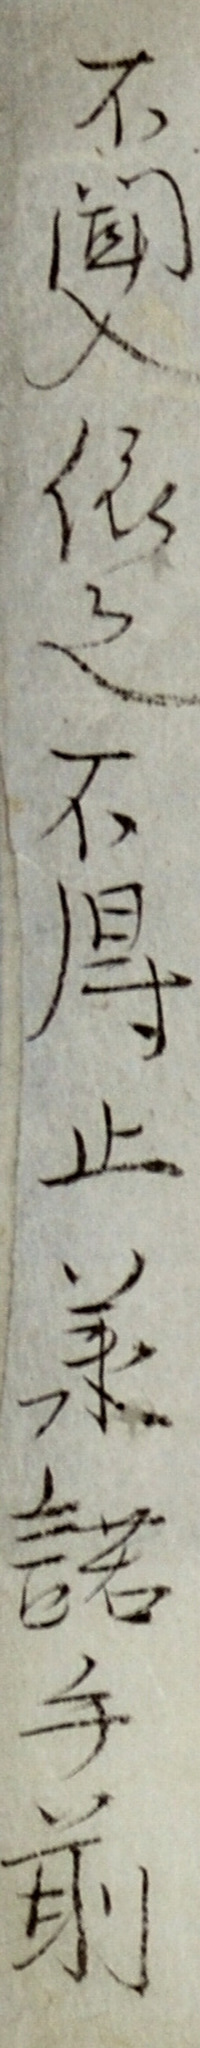不聞入依之不得止承諾午前

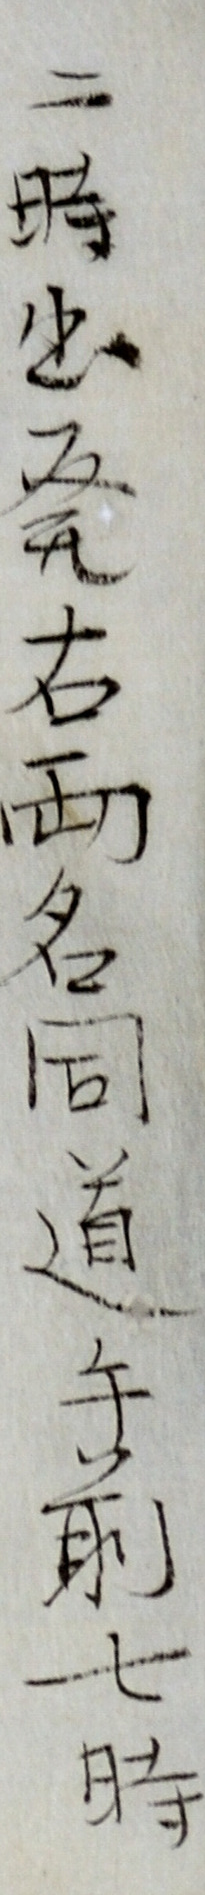二時出発右両名同道午前七時
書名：小出耕地新田耕地山論測量控
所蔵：伊那市立高遠町図書館・合同会社AMANE
